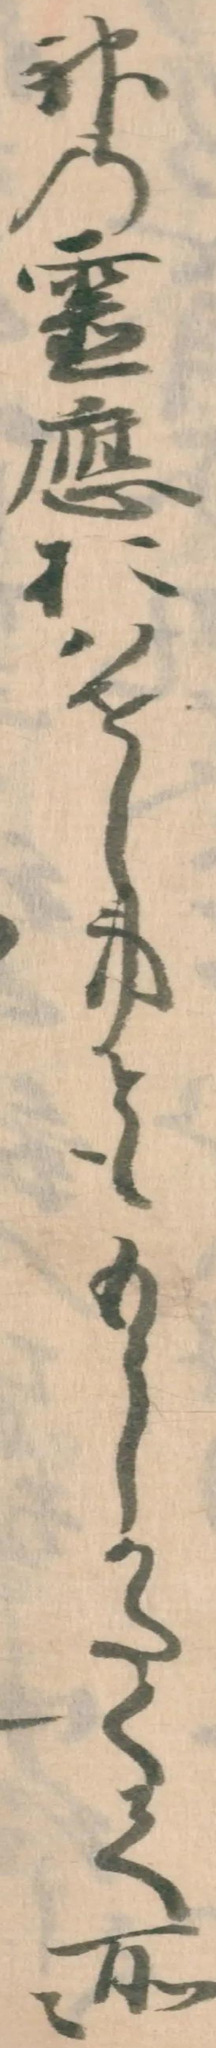神の霊応おはせし事とももらしかたくて所々
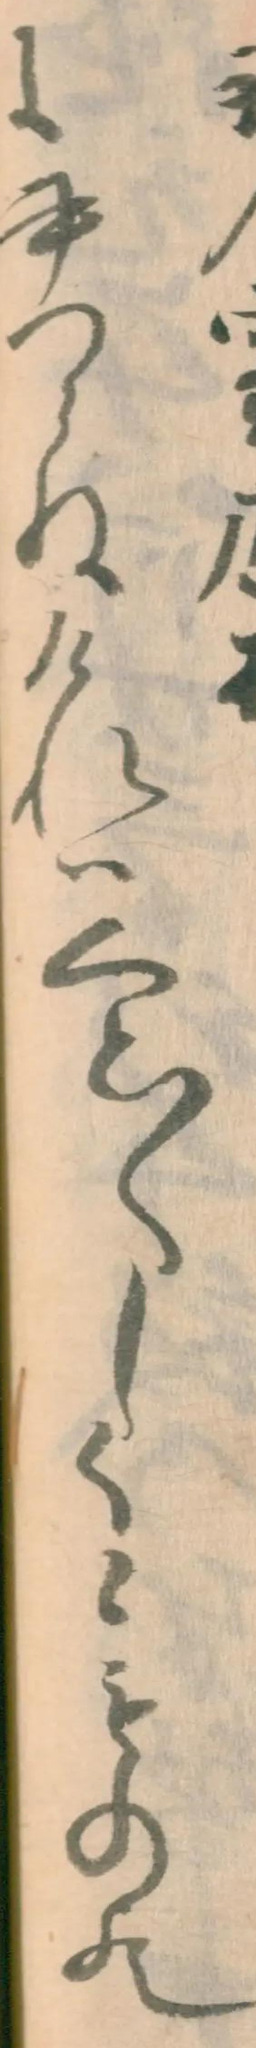に書つらねけれはくと〳〵しく候もの歟
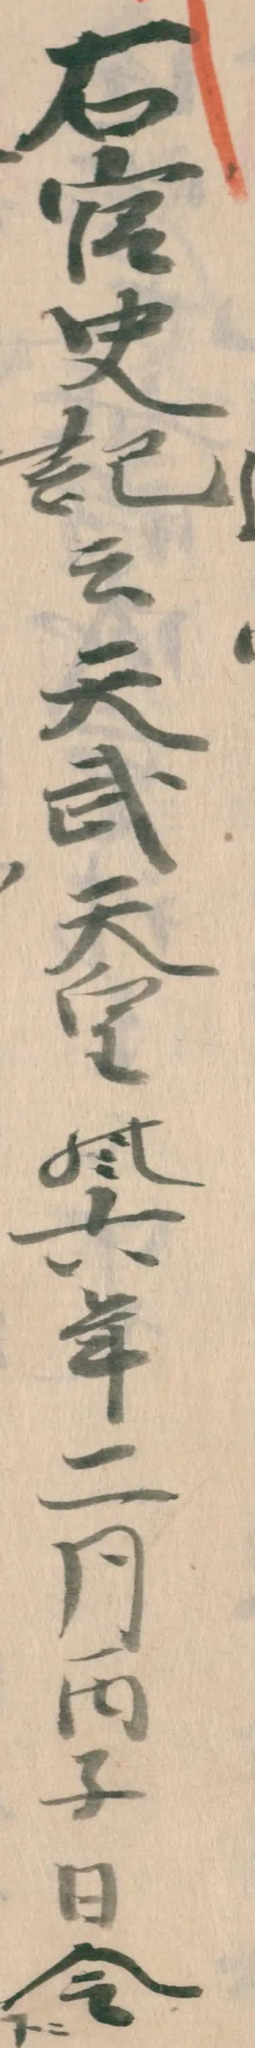右官史記云天武天皇の六年二月丙子日令二
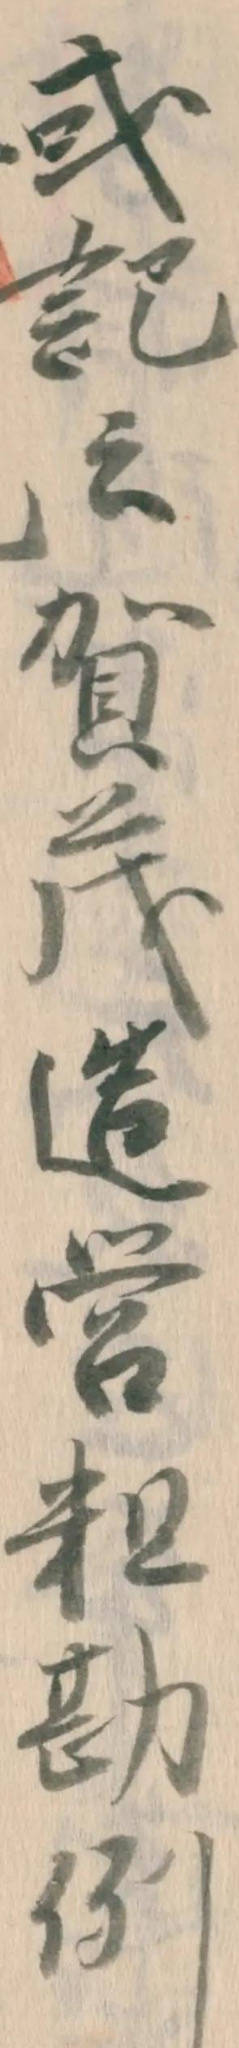或記云賀茂造営粗勘例
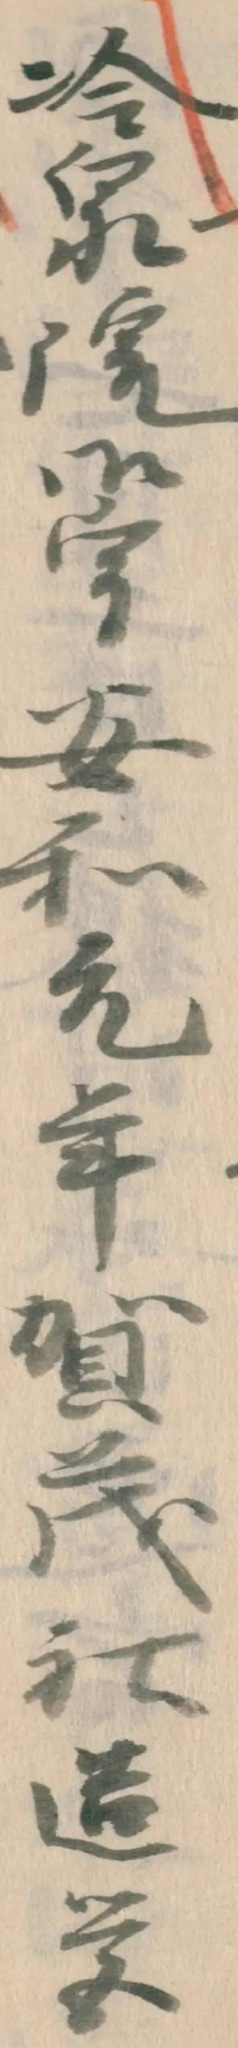冷泉院御宇安和元年賀茂社造営
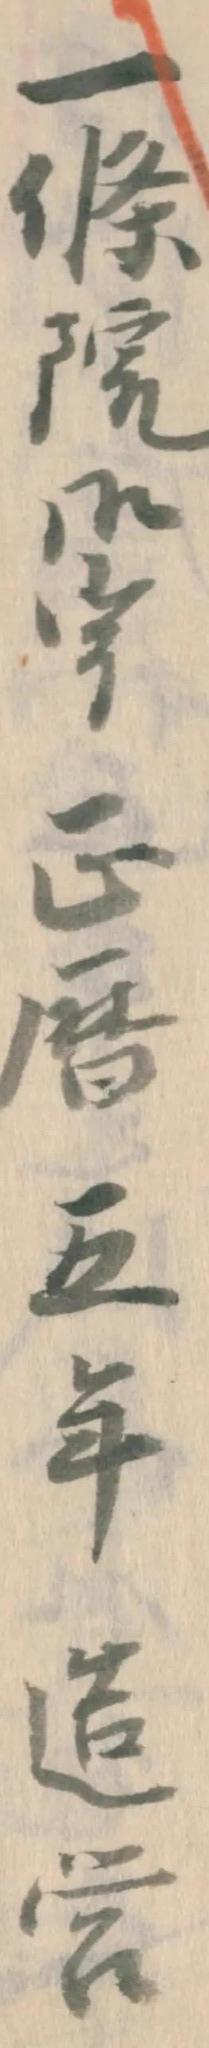一条院御宇正暦五年造営
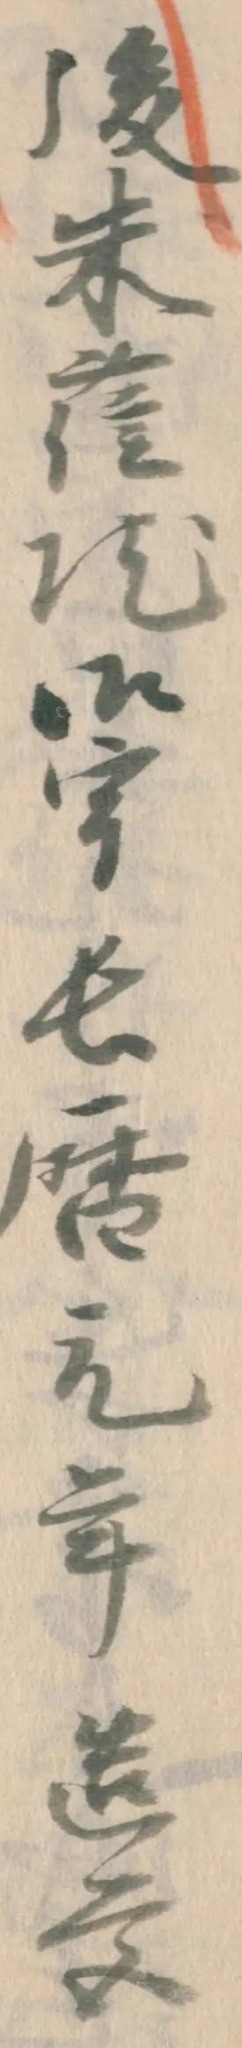後朱雀院御宇長暦元年造営
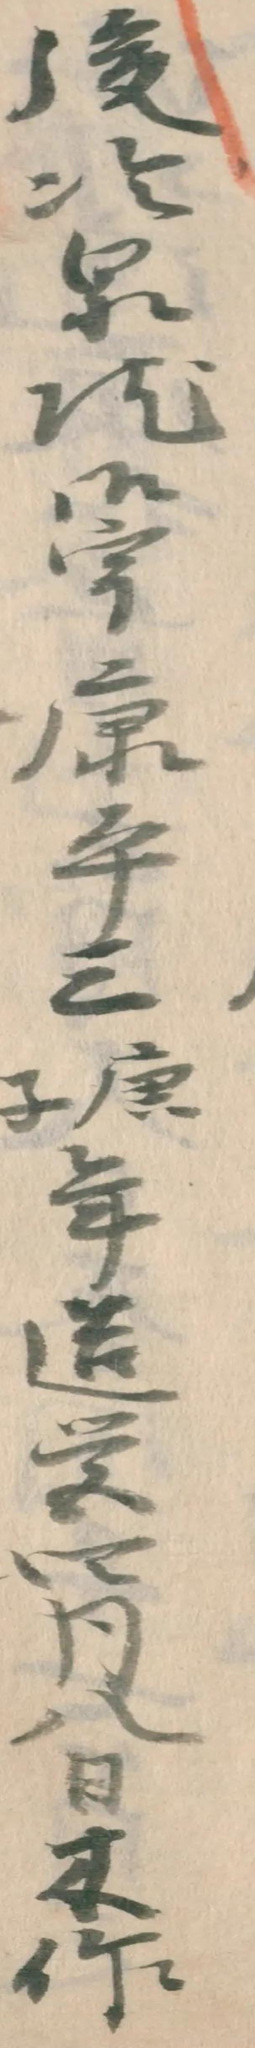後冷泉院御宇康平三庚子年造営四月八日木作
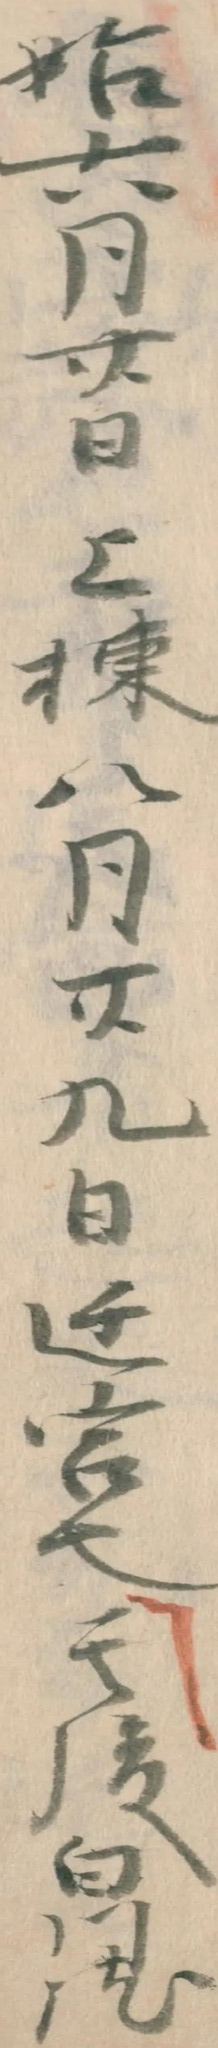始六月廿日上棟八月廿九日遷宮也其後白川院
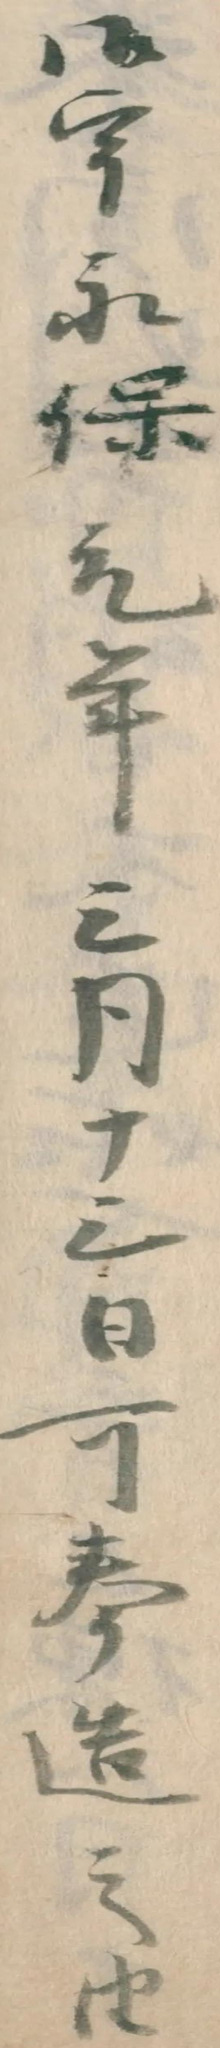御宇永保元年三月十三日可奉造之由

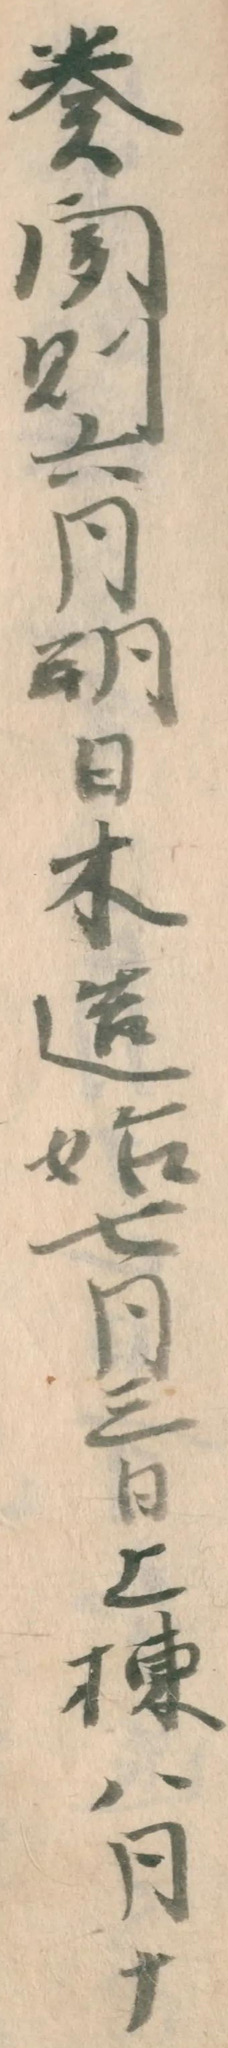奏聞則六月朔日木造始七月三日上棟八月十
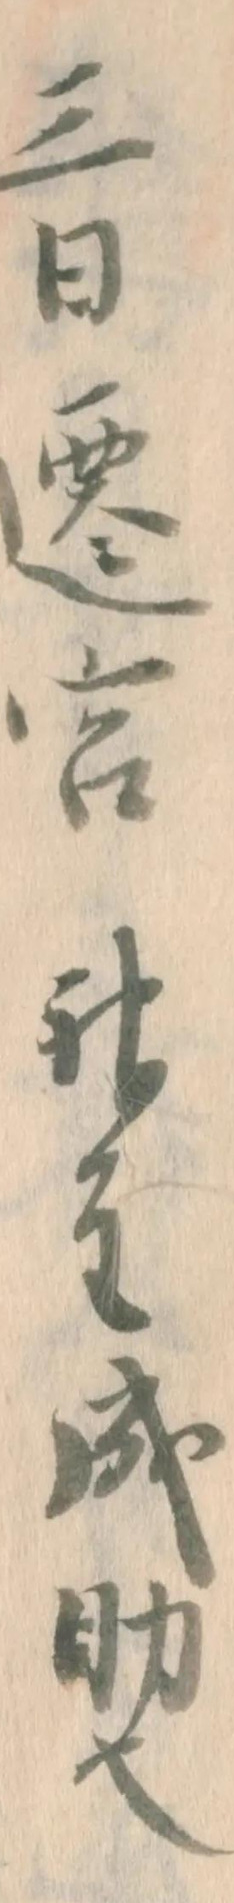三日遷宮神主成助也
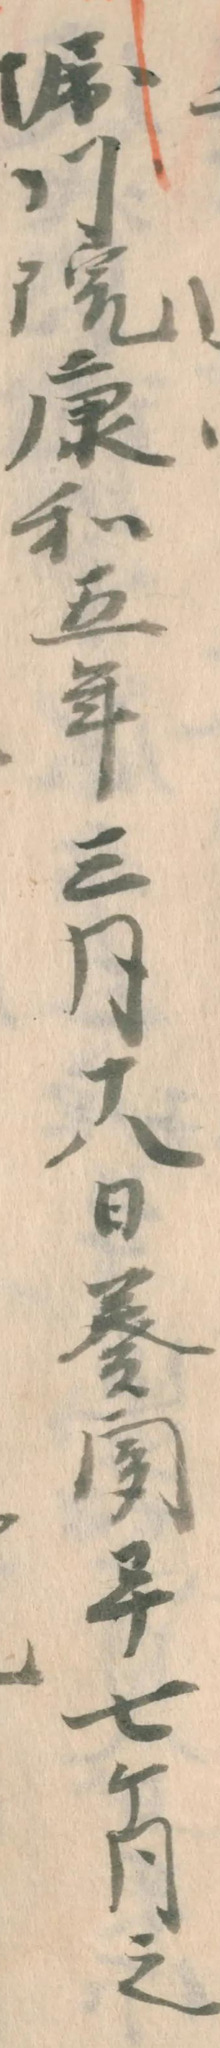堀川院康和五年三月十八日奏聞畢七ケ月之
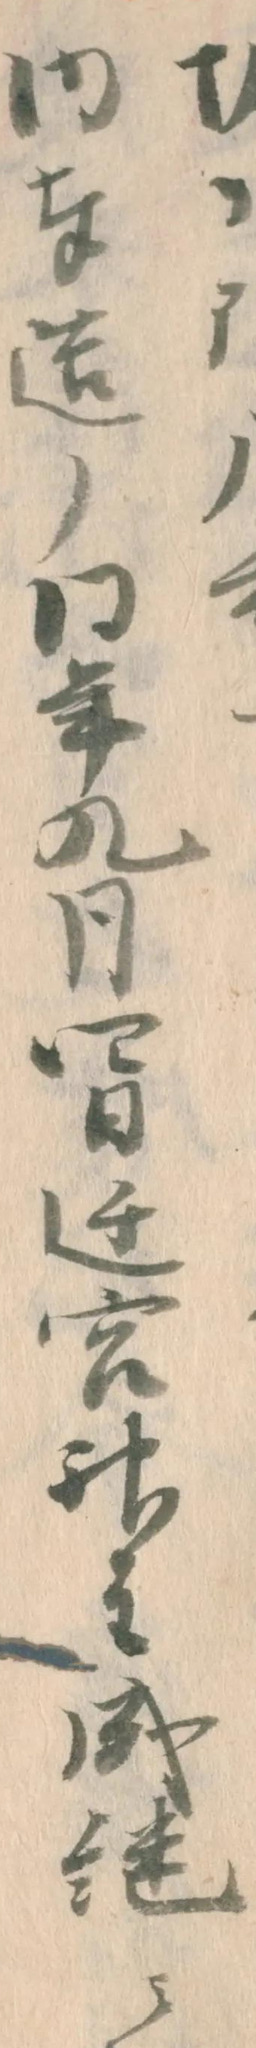内奉造ノ同年九月四日遷宮神主成継云々
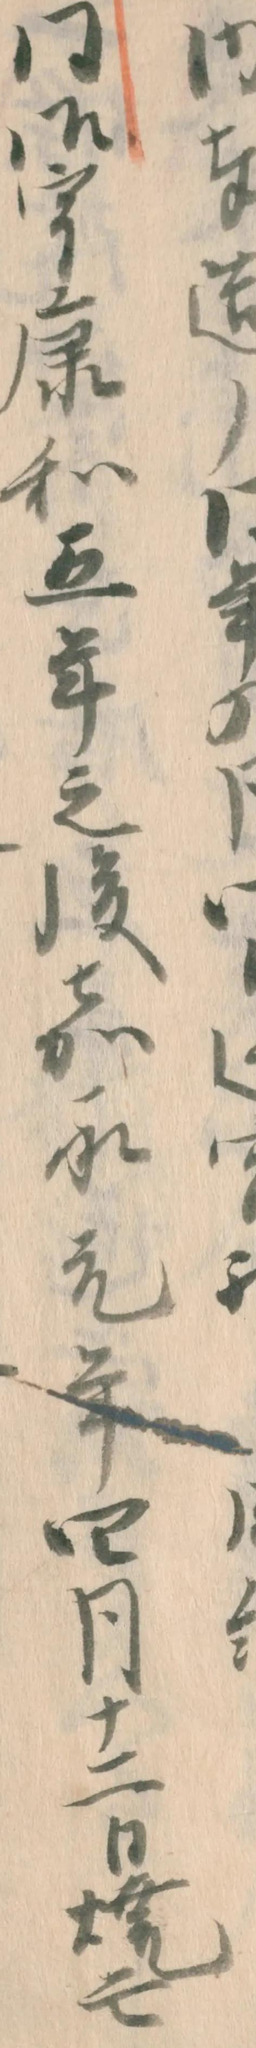同御宇康和五年之後嘉承元年四月十二日焼亡
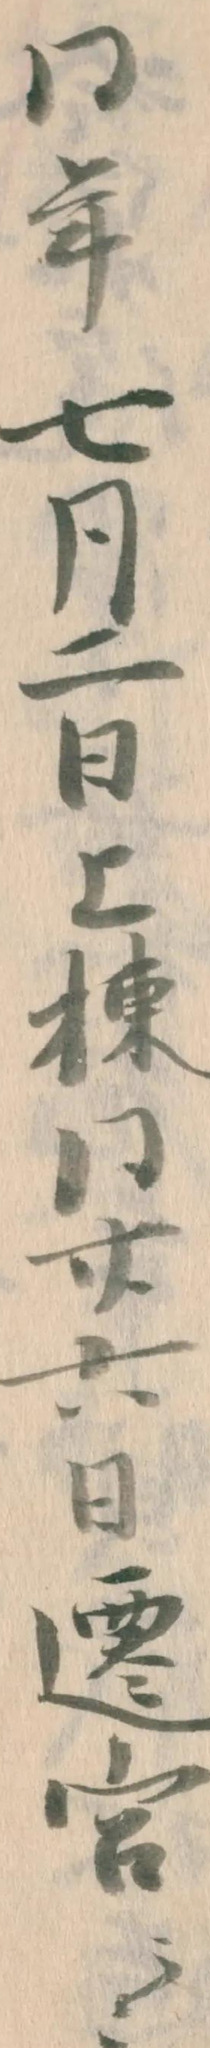同年七月二日上棟同廿六日遷宮云々
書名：賀茂社記録. 第1冊
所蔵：国立国会図書館 National Diet Library, JAPAN
